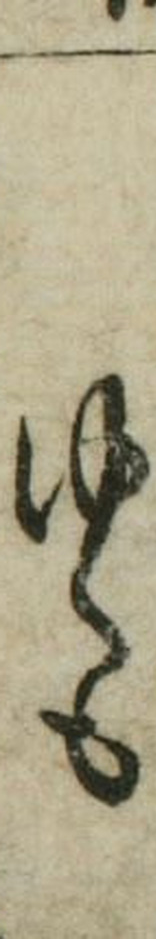ゆくも
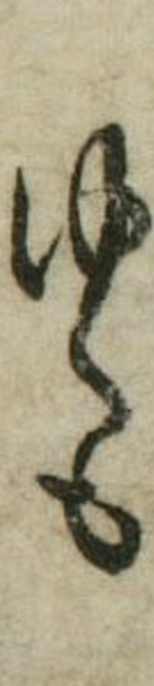ゆくも
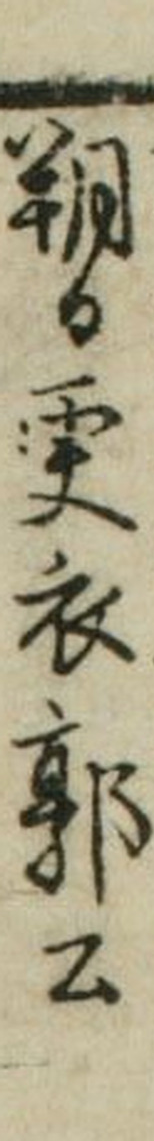朔日更衣郭公
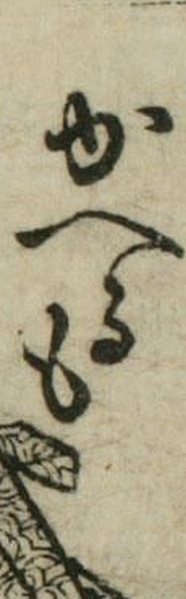かへるも
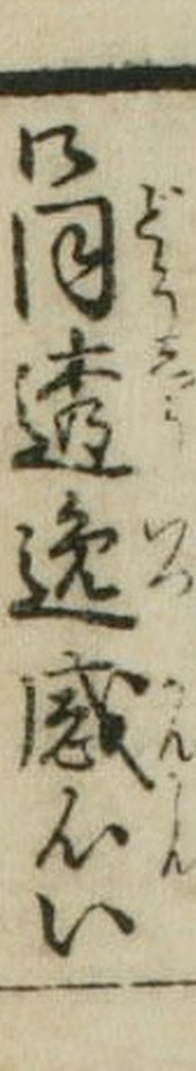御同秀逸感心い
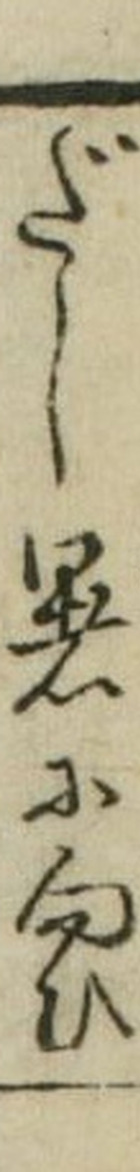だし暑に向ひ
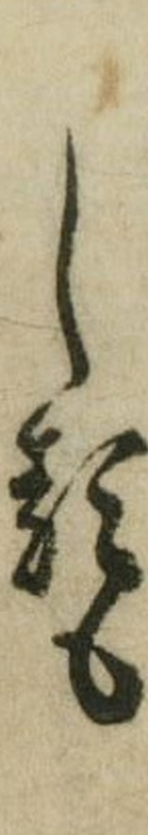しるも
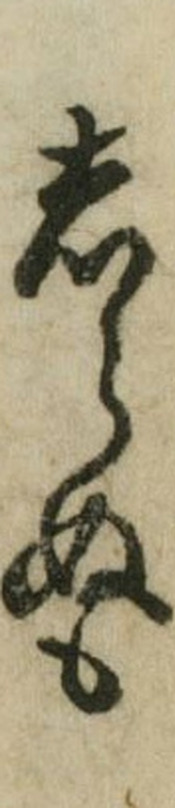しらぬも
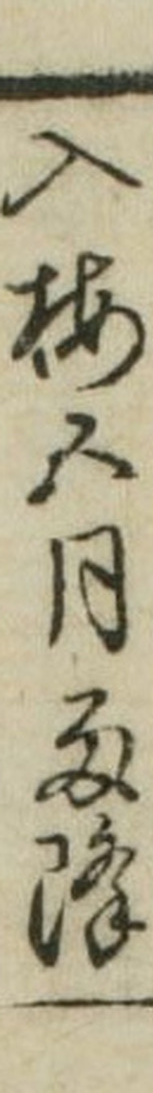入梅五月雨降
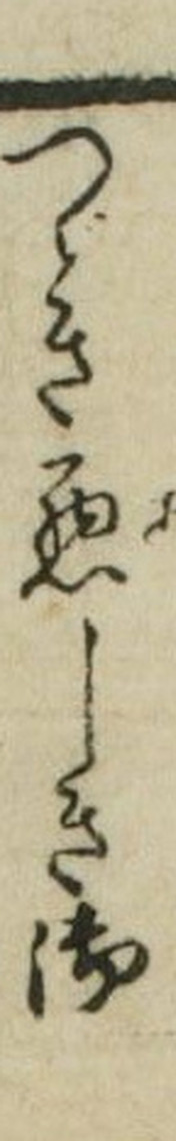つゞき悪しき御
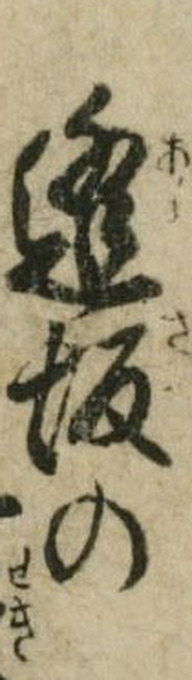逢坂の
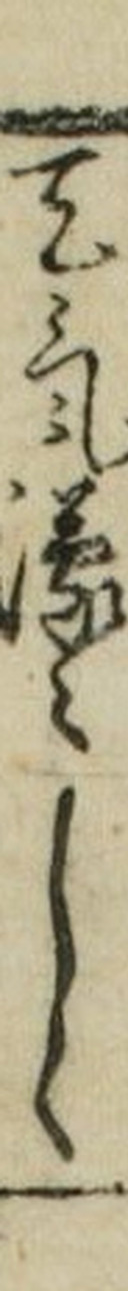天気濛々しく
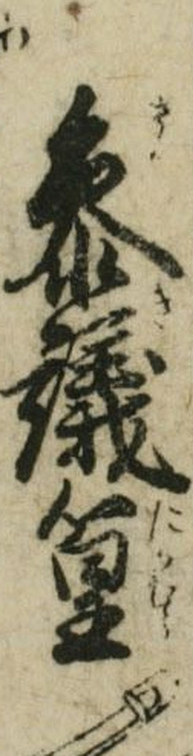参議篁
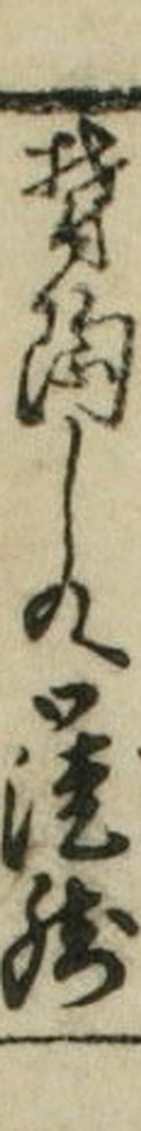鬱陶しく御徒然
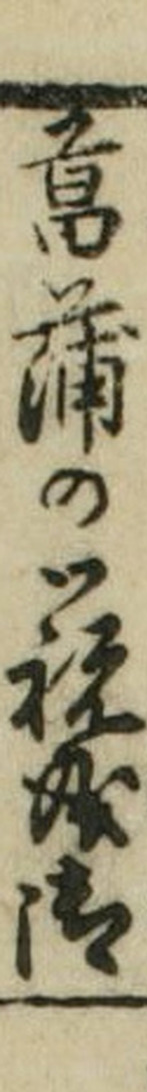菖蒲の御祝儀御
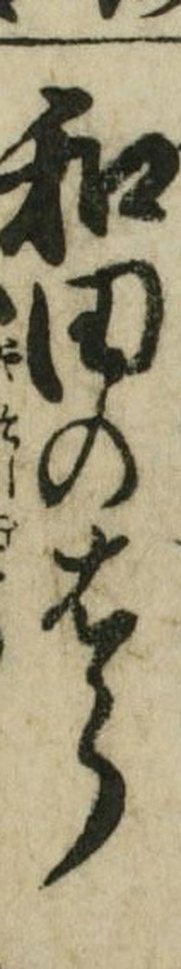和田のはら
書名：百人一首
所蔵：東京学芸大学教育コンテンツアーカイブ
